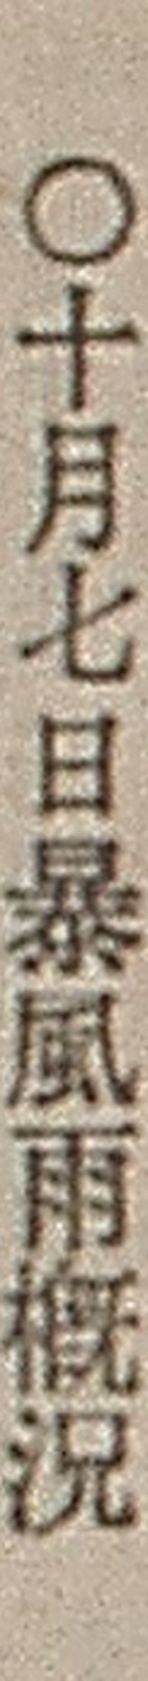〇十月七日暴風雨概況
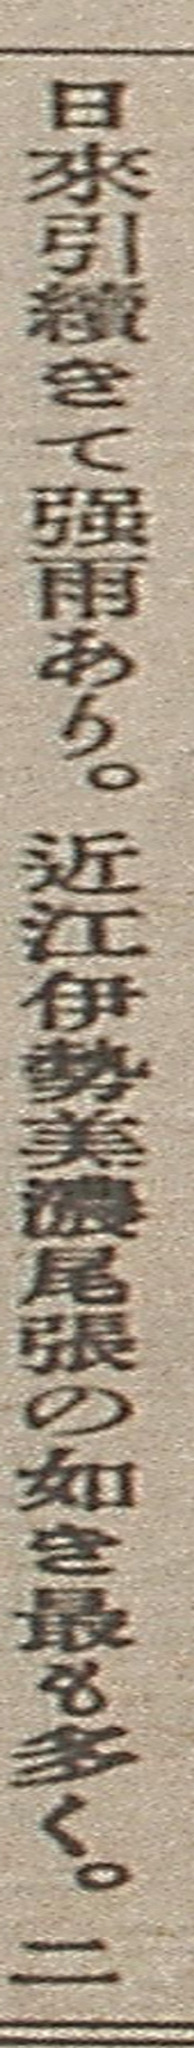日来引続きて強雨あり。近江伊勢美濃尾張の如き最も多く。二
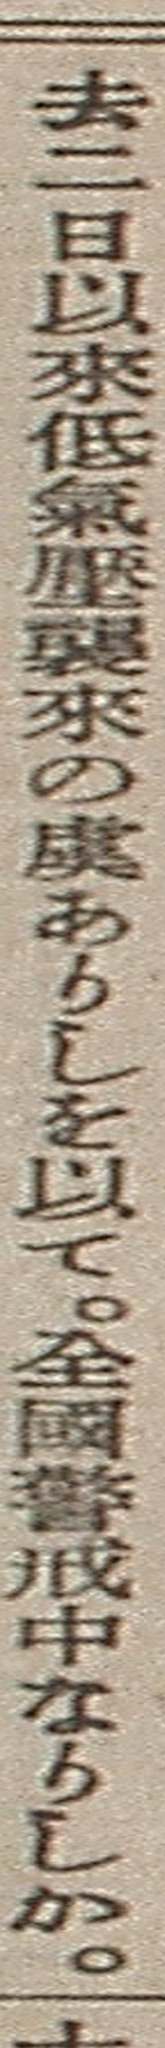去二日以来低気圧襲来の虞ありしを以て。全国警戒中なりしか。
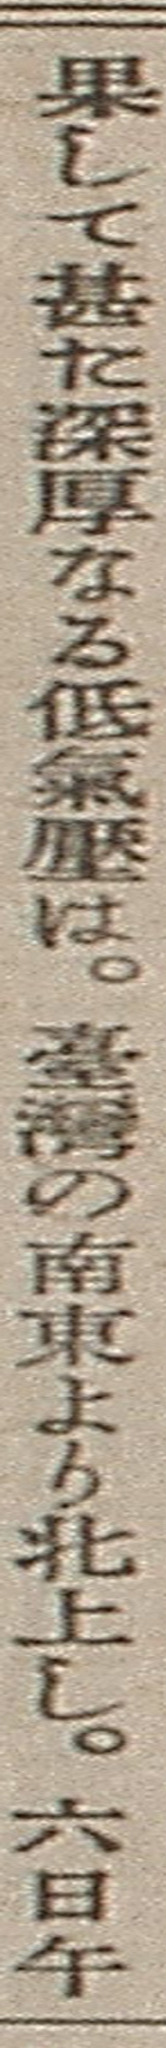果して甚た深厚なる低気圧は。台湾の南東より北上し。六日午
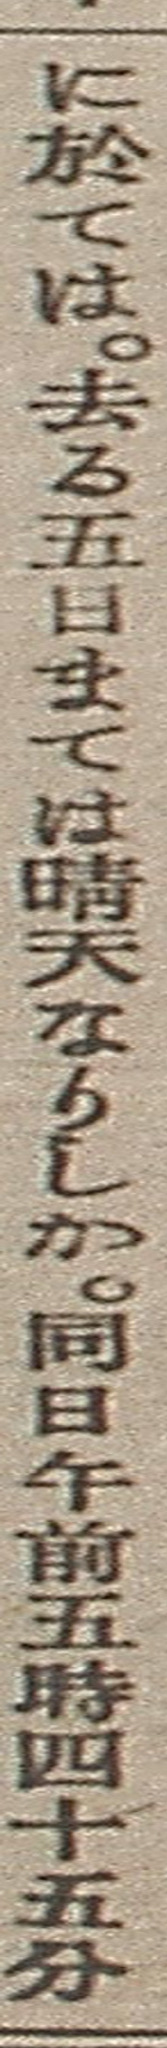に於ては。去る五日まては晴天なりしか。同日午前五時四十五分
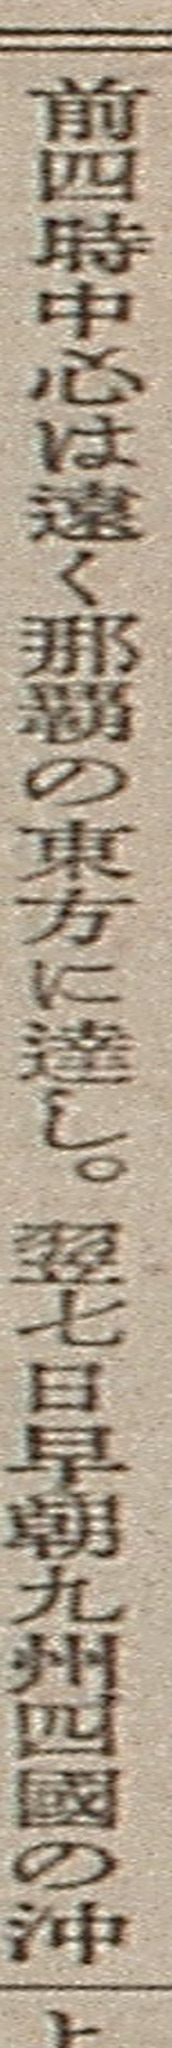前四時中心は遠く那覇の東方に達し。翌七日早朝九州四国の沖
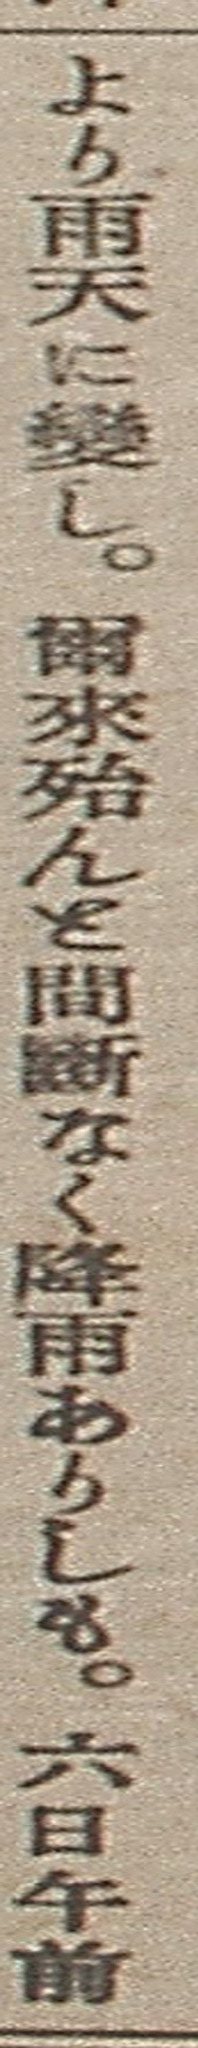より雨天に変し。爾来殆んと間断なく降雨ありしも。六日午前
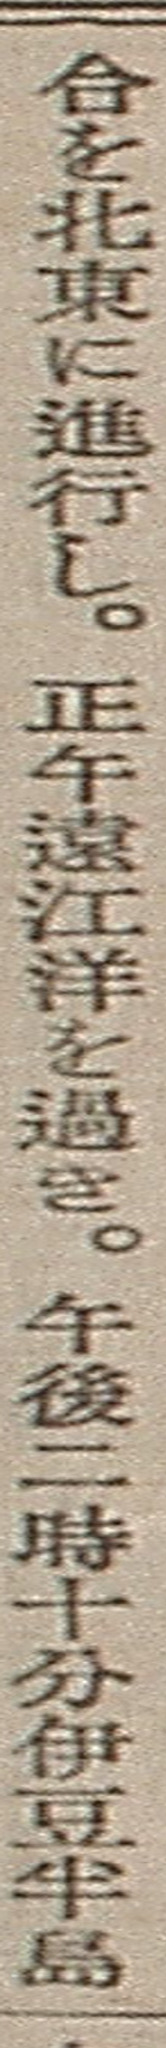合を北東に進行し。正午遠江洋を過き。午後二時十分伊豆半島
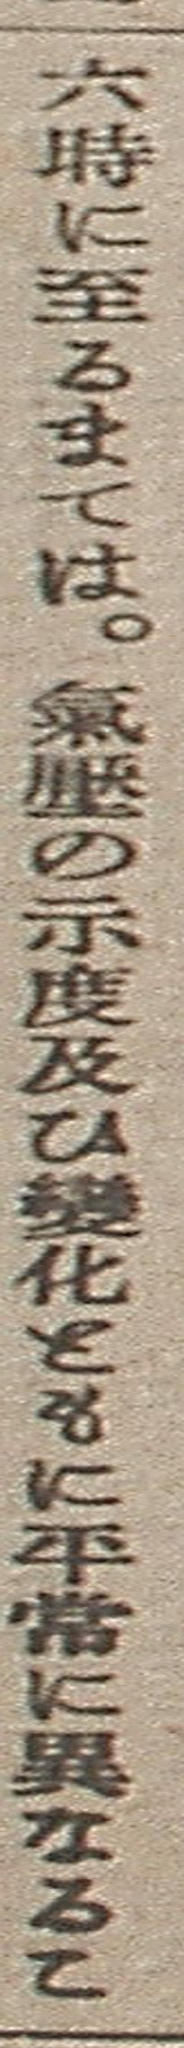六時に至るまては。気圧の示度及ひ変化ともに平常に異なるこ

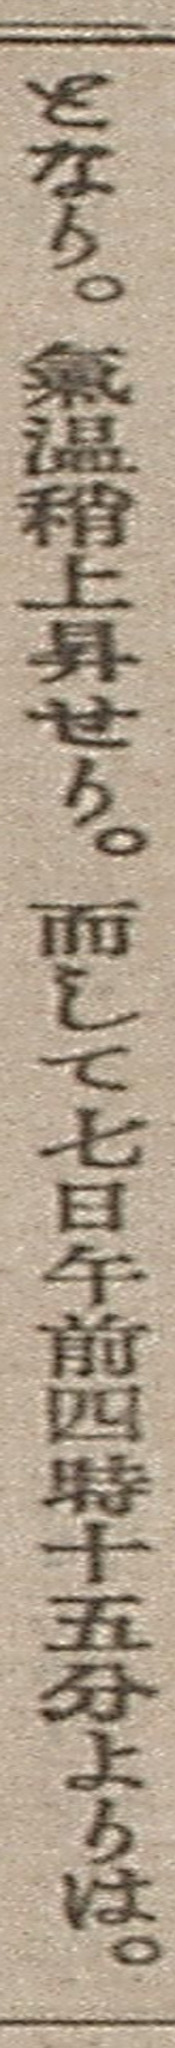となり。気温稍上昇せり。而して七日午前四時十五分よりは。
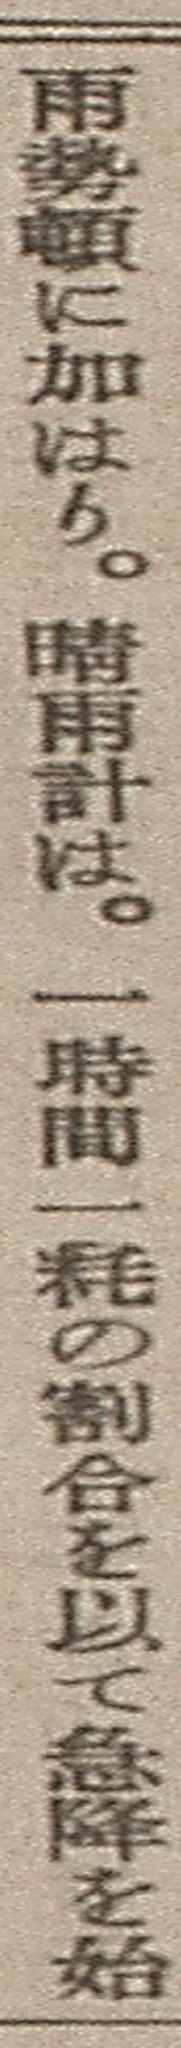雨勢頓に加はり。晴雨計は。一時間一粍の割合を以て急降を始
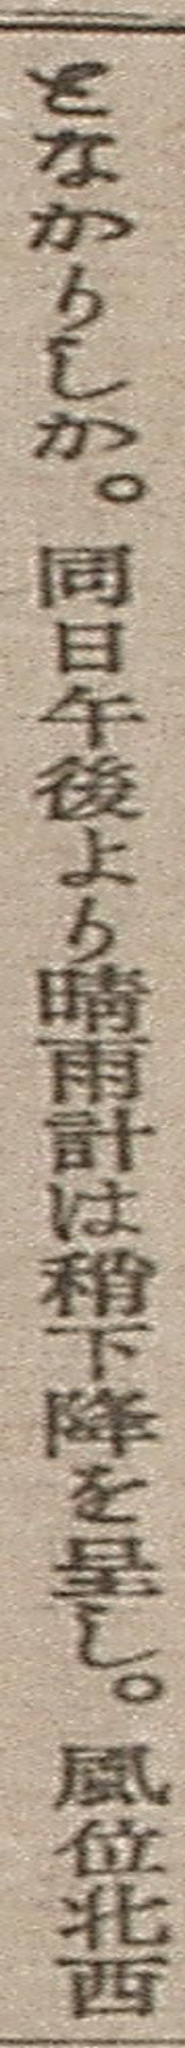となかりしか。同日午後より晴雨計は稍下降を呈し。風位北西
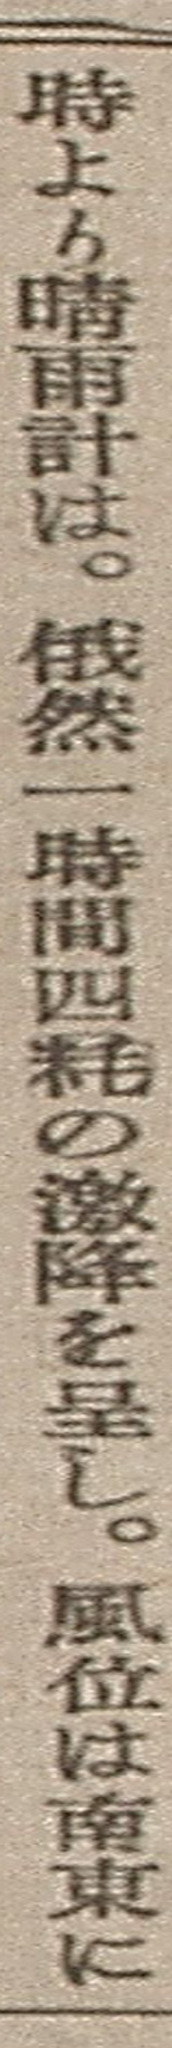時より晴雨計は。俄然一時間四粍の劇降を呈し。風位は南東に
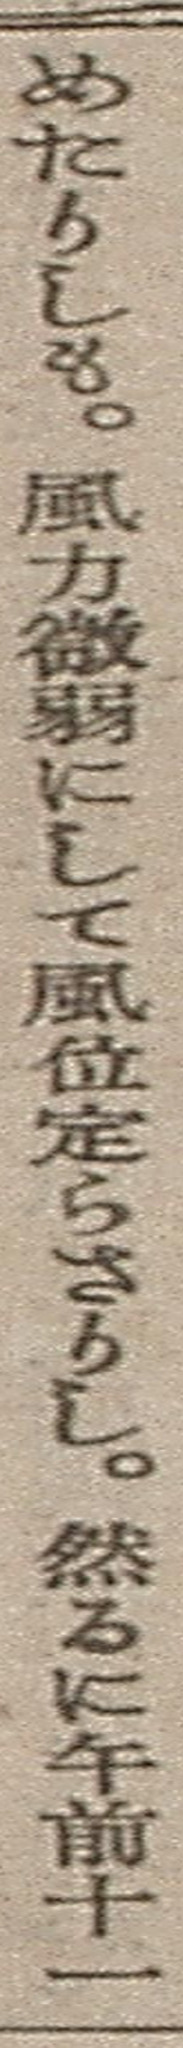めたりしも。風力微弱にして風位定らさりし。然るに午前十一
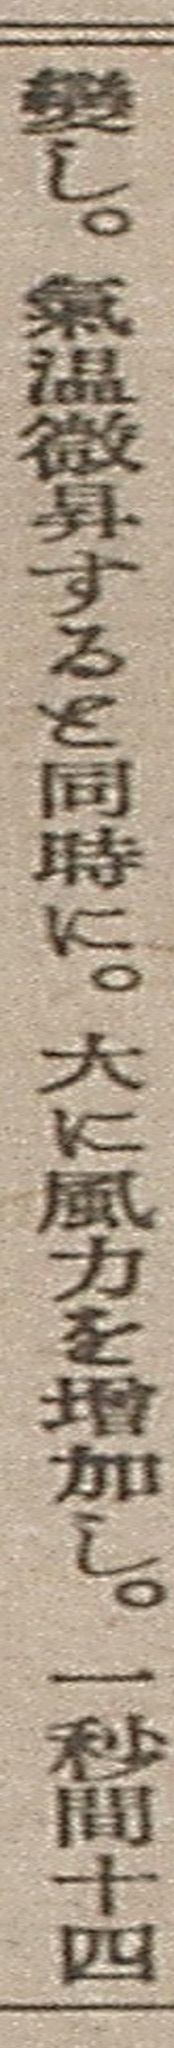変し。気温微昇すると同時に。大に風力を増加し。一秒間十四
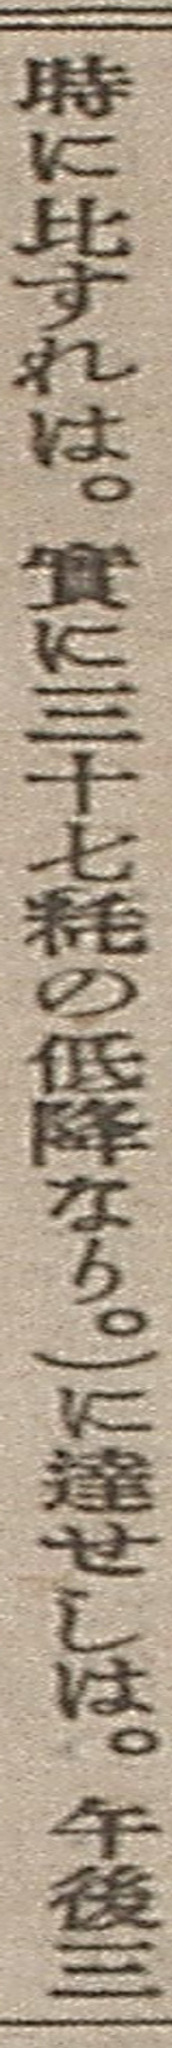時に比すれは。実に三十七粍の低降なり。）に達せしは。午後三
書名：風俗畫報臨時増刊第百九十九號　明治三十二年十月各地災害圖會（前編之續）
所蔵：東京大学地震研究所図書室 Earthquake Research Institute Library, The University of Tokyo, JAPAN
